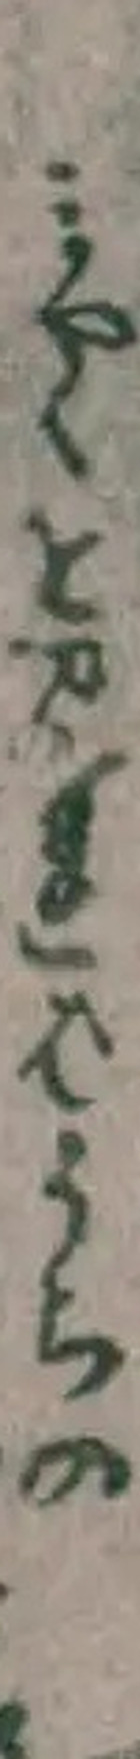みやくを見れはうちの
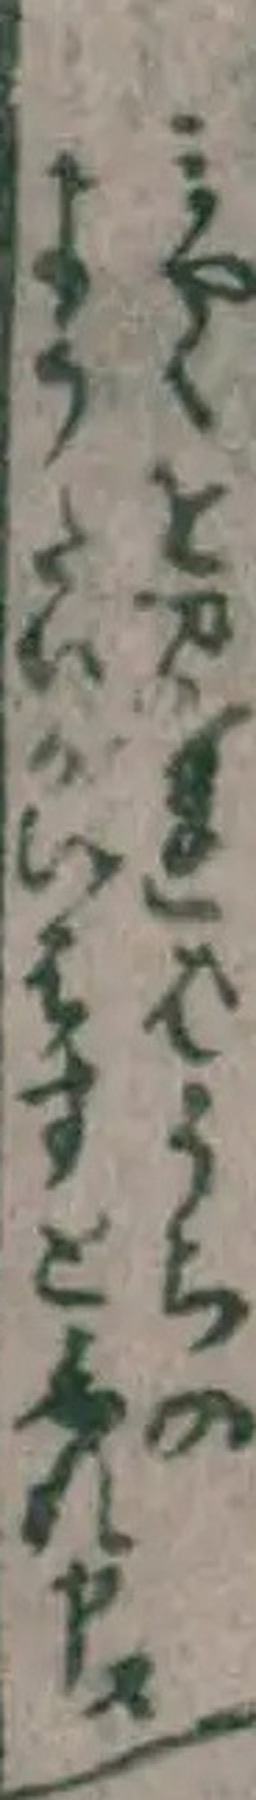ようたいがいはすとしれ申す
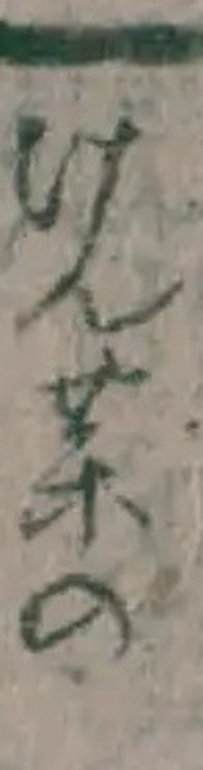けん薬の
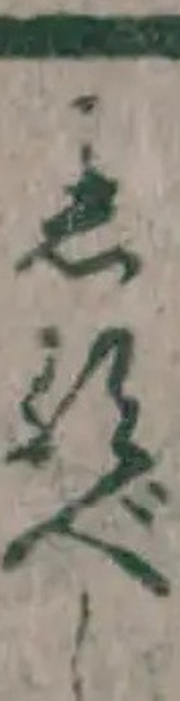しるべし

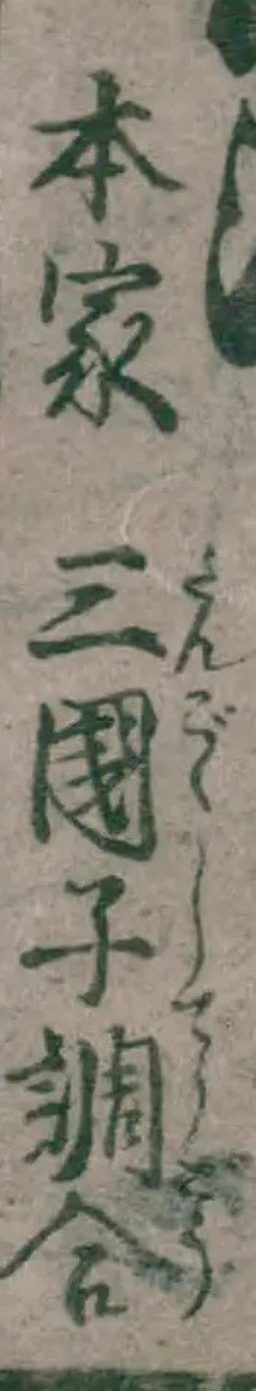本家三国子調合
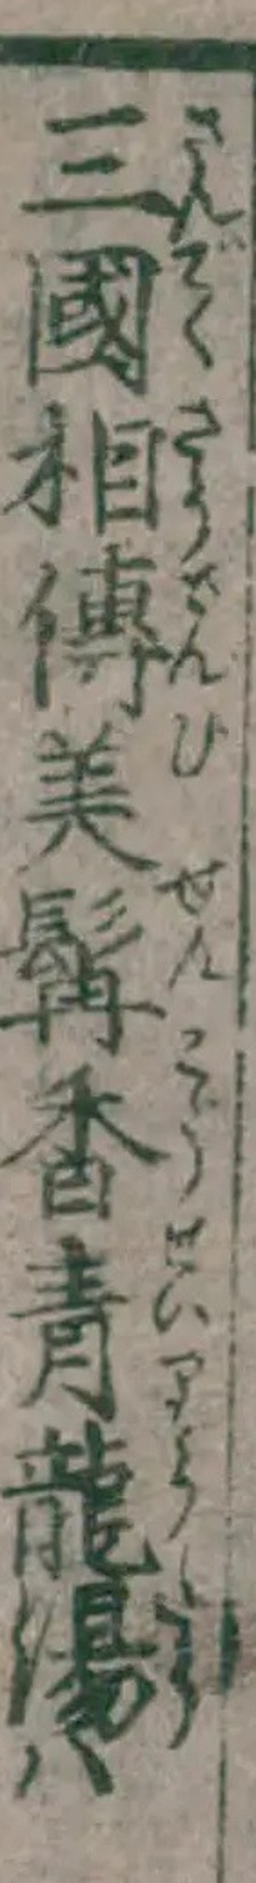三国相伝美髯香青龍湯は
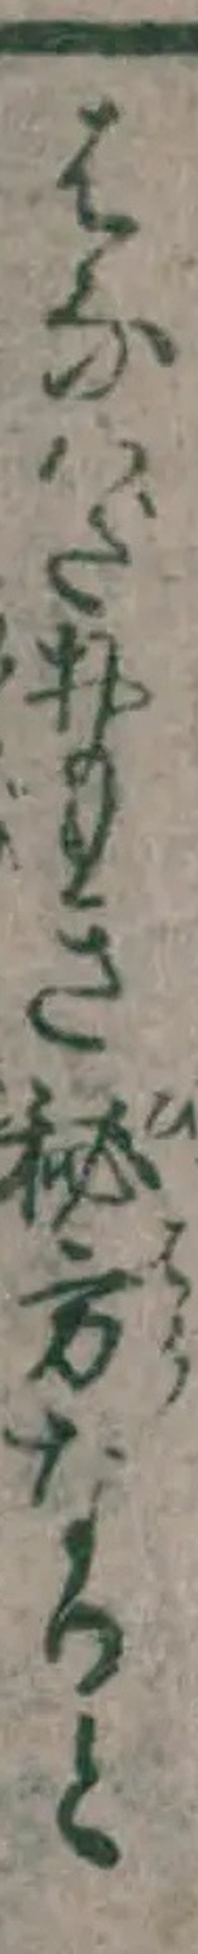はなはだおもき秘方なりと
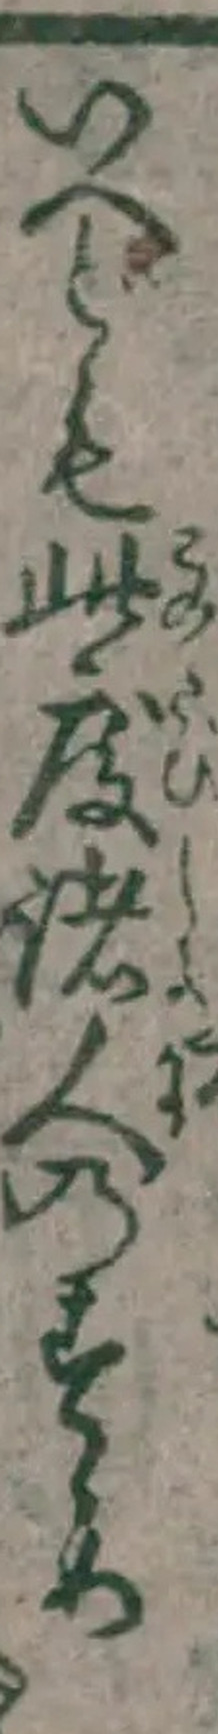いへども此度諸人のすゝめ
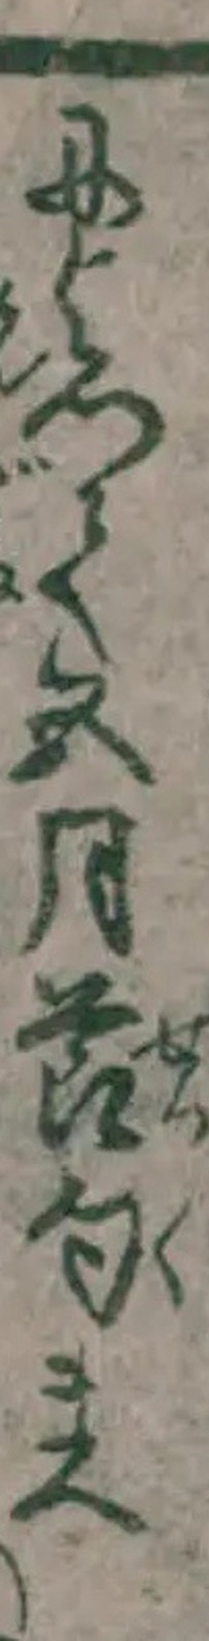によつて五月節句まへ
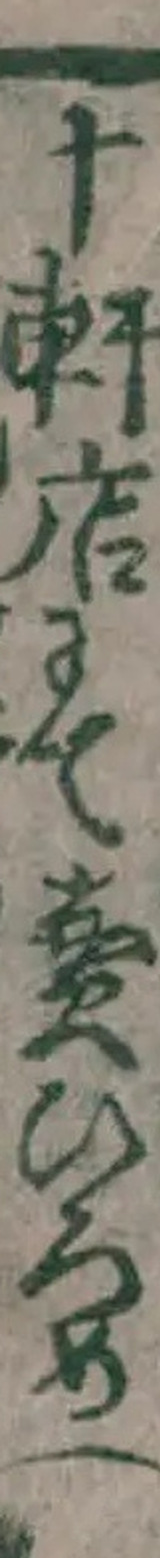十軒店にて売ひろめ
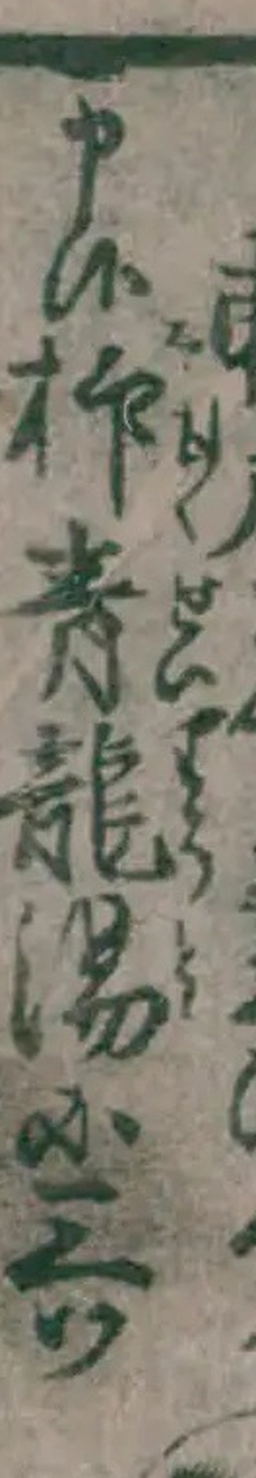申候抑青龍湯に三ツ
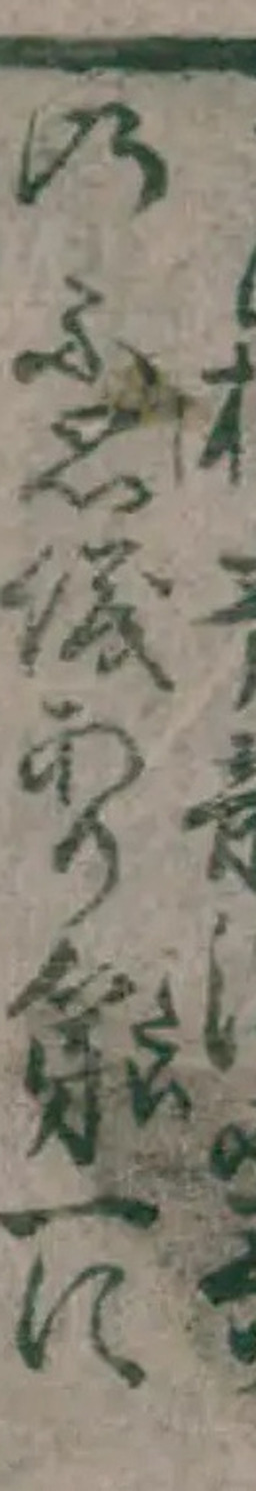の不思議あり第一に
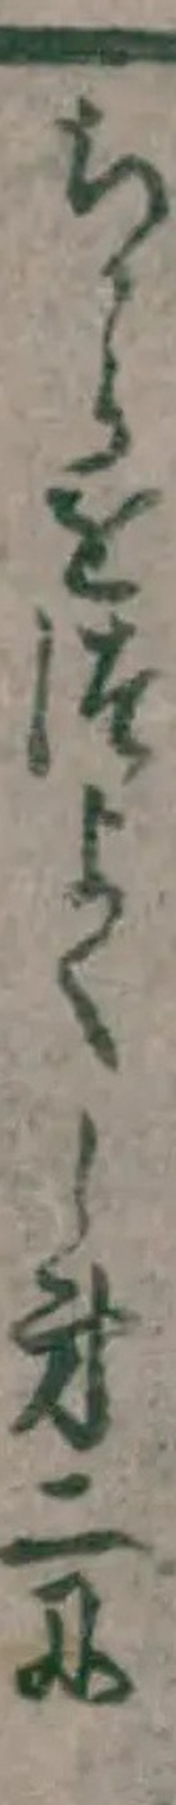ちからをつよくし第二に
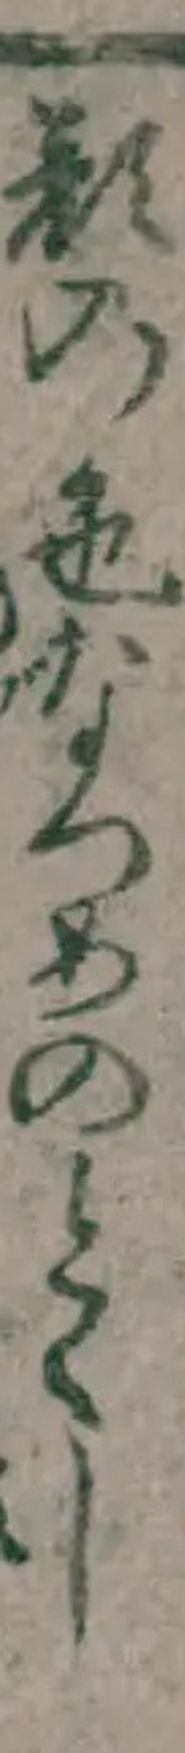顔の色なつめのことくし
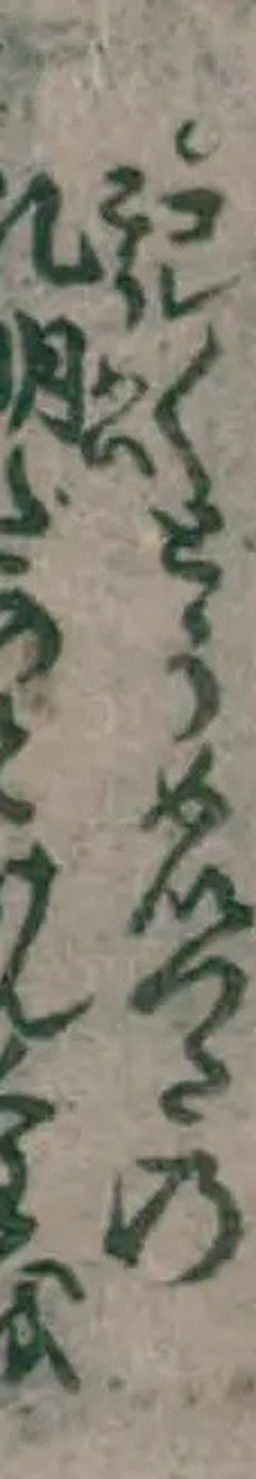孔明たのとけんくわを
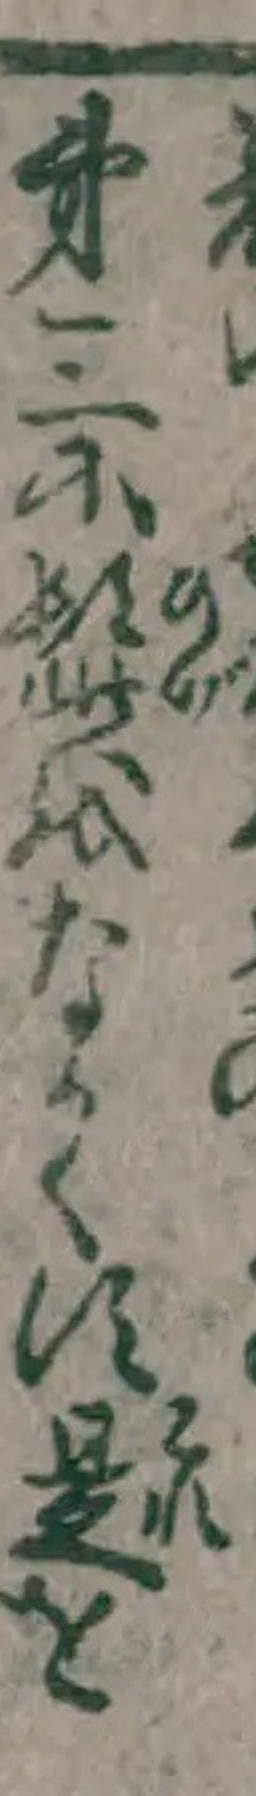第三に髭をなかくす是を
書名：視薬霞報条 3巻
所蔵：国立国会図書館 National Diet Library, JAPAN
